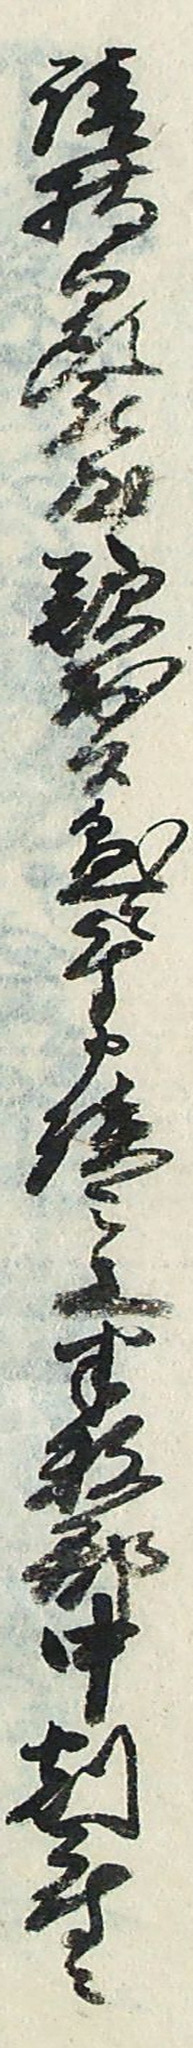請持与頭庄屋へ願出候懸に付申談之上半数郡中割符に
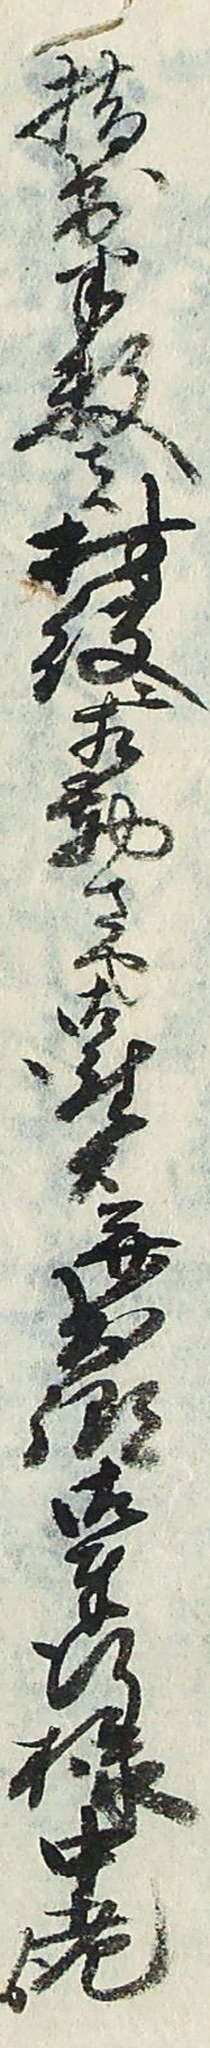指出半数は村役に相勤させ御座候并出郷御奉行様中老より
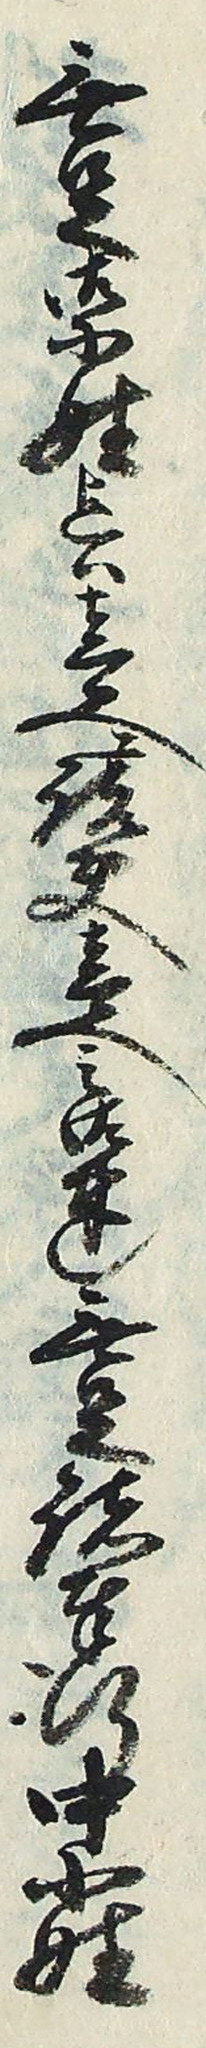無足御小姓迄は一人に詰夫一人の御達無足諸奉行中小姓
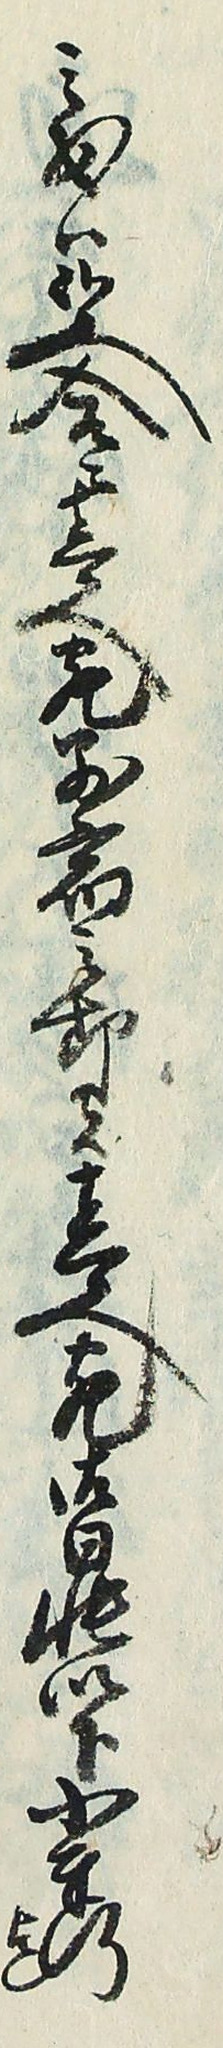之義は二人合に一人宛別宿之節は一人宛御日帳以下小奉行迄
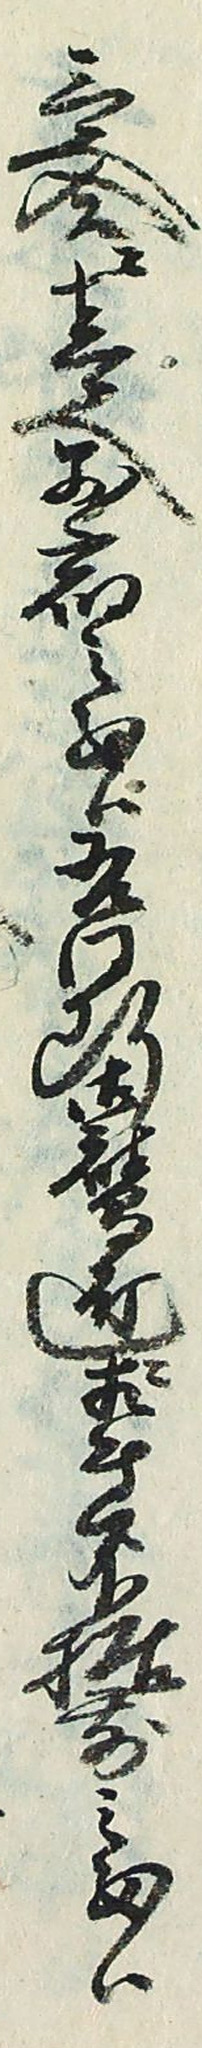三人合に一人別宿之義は右同断御鷹匠に相付候下据前之義は
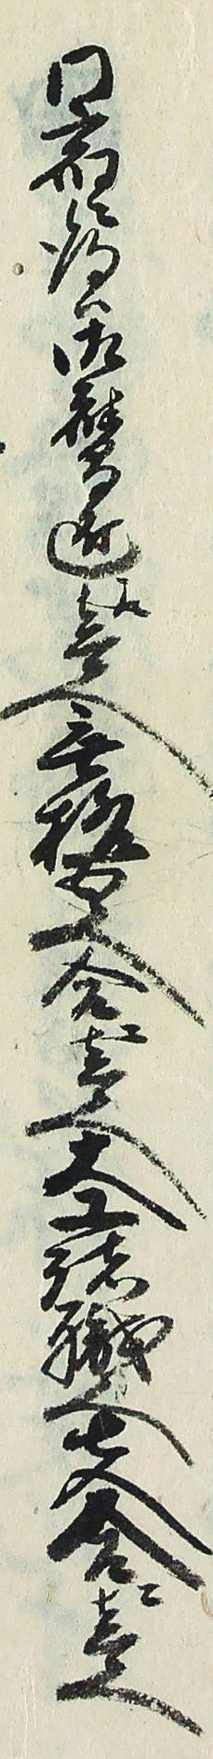同宿に候得は御鷹匠え一人無格五人合に一人大工諸職人七人合に一人
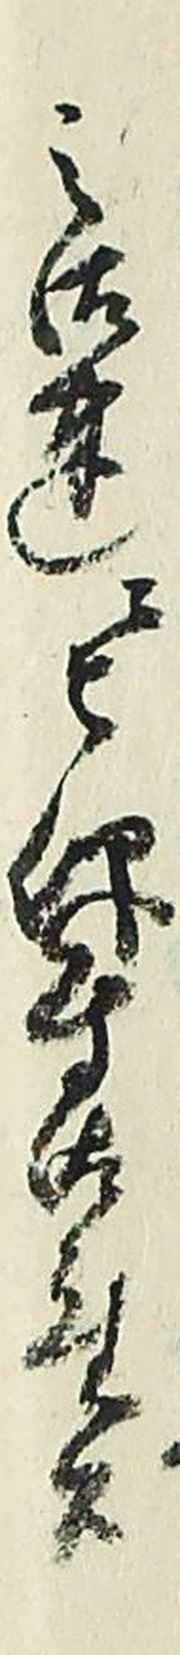之御達に被仰付御座候
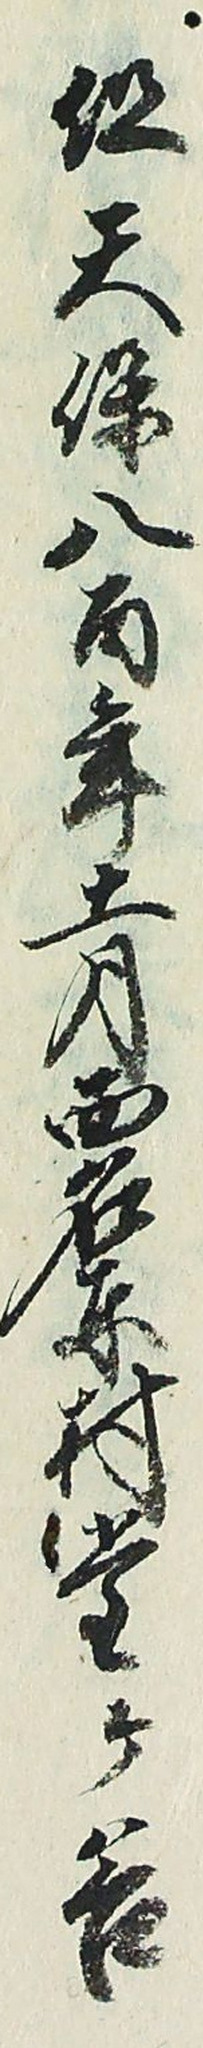但天保八酉年十一月西名東村堂ケ谷
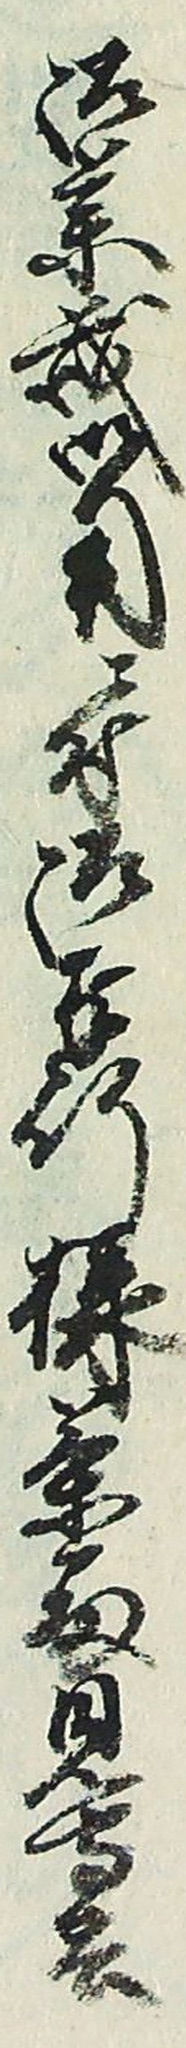御茶蔵御用に付御奉行様茶番見守共
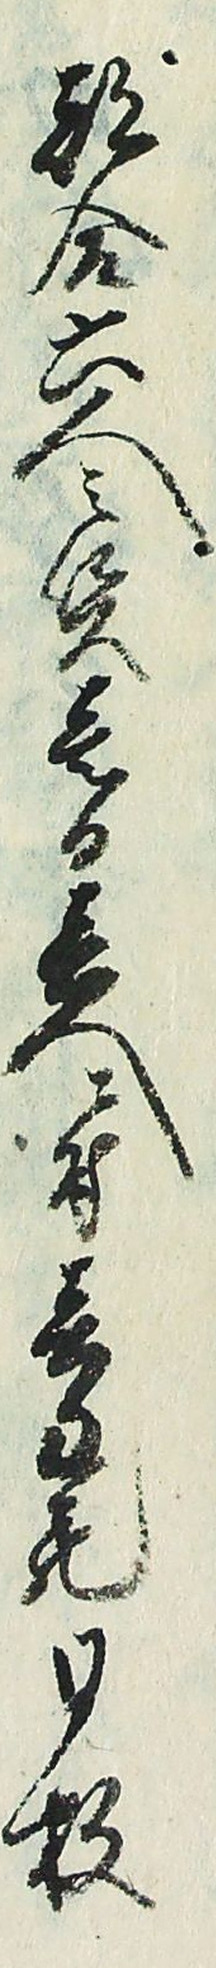都合六人之賃一日一人に付一匁宛日数
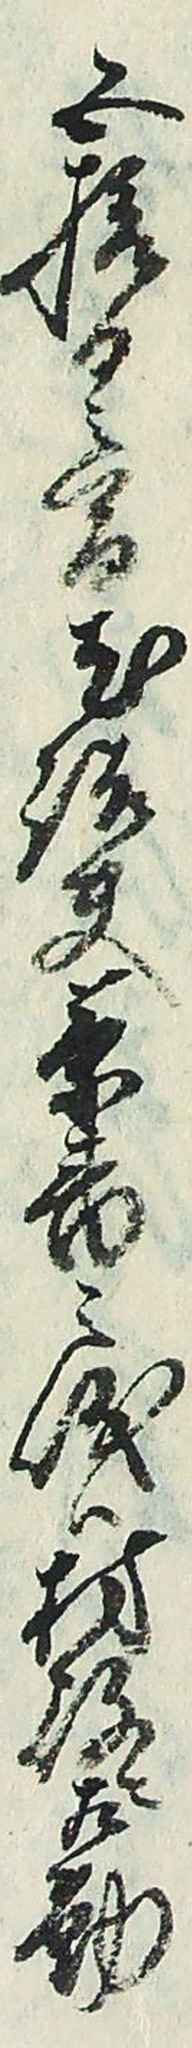五十日之間尤詰夫茶番之儀は村役に相勤
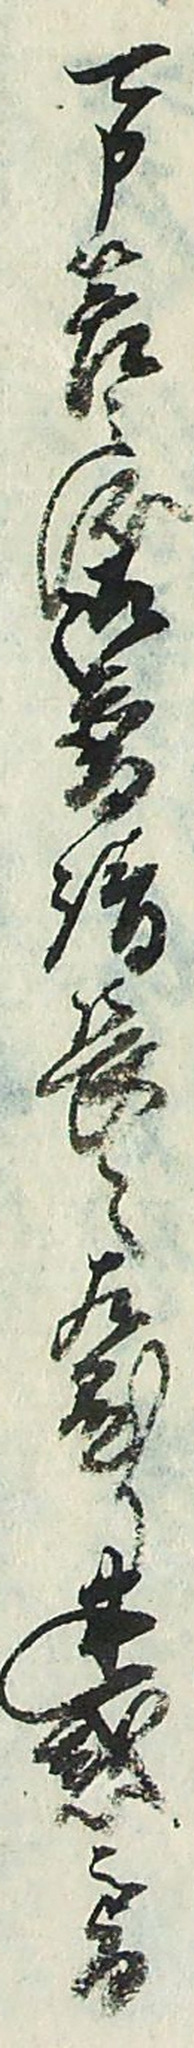可申筈之所御普請長々相懸り迷惑之旨
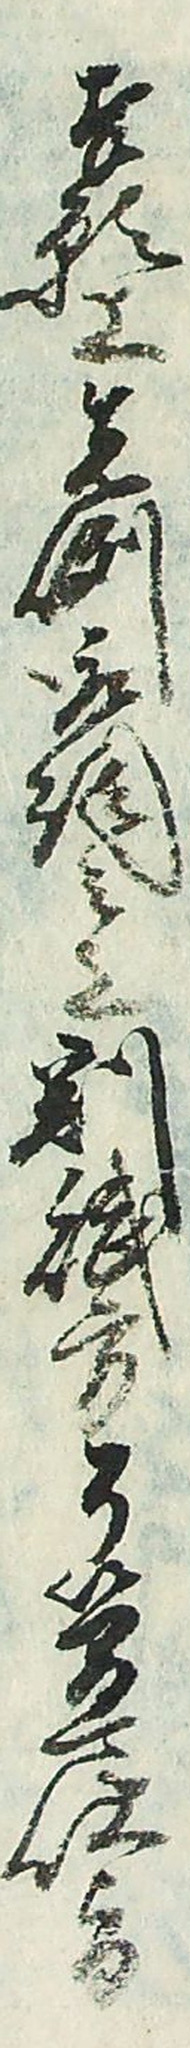奉願上先例取調之上割賦方了簡可仕旨

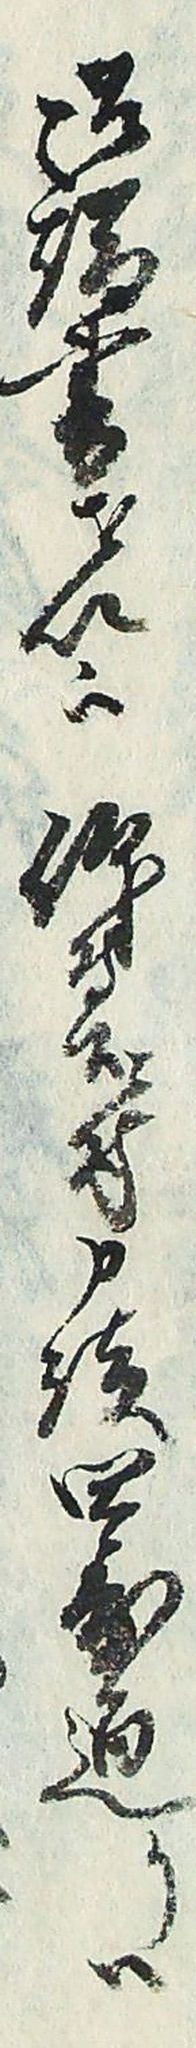御端書を以被仰付候に付申談四歩通りは
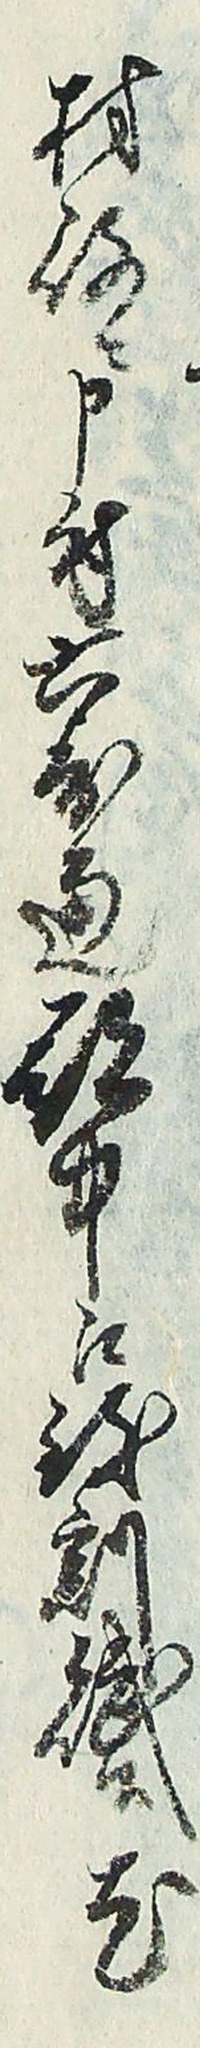村役に申付六歩通郡中え致割賦候尤
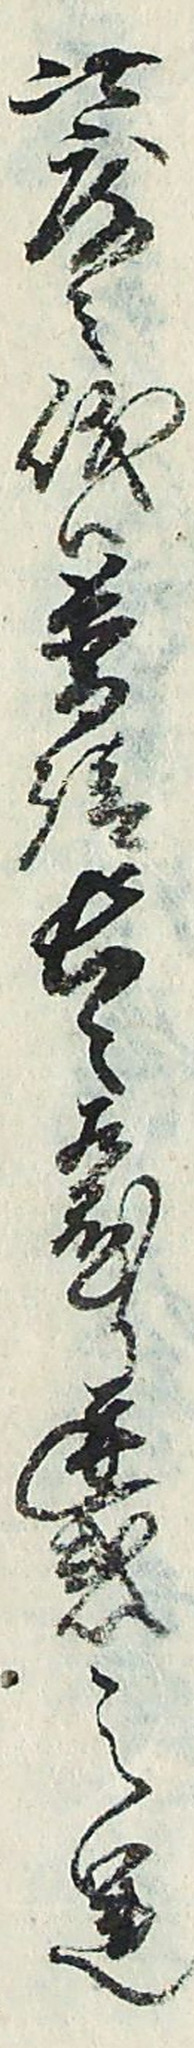此度之儀は普請長々相懸り迷惑之運
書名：諸割賦物賃銀定記録帳
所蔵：鳴門教育大学 Naruto University of Education
